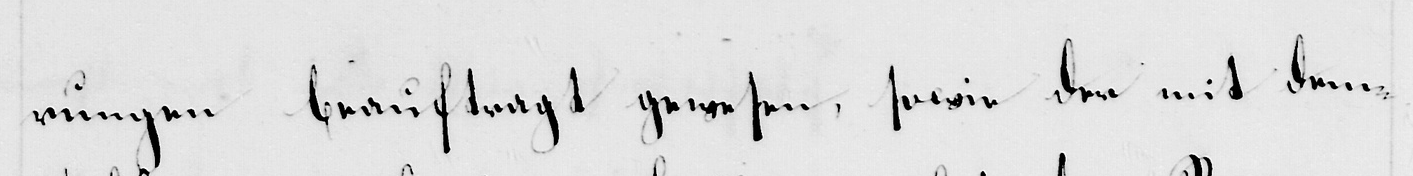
rungen beauftragt gewesen, sowie der mit dem¬
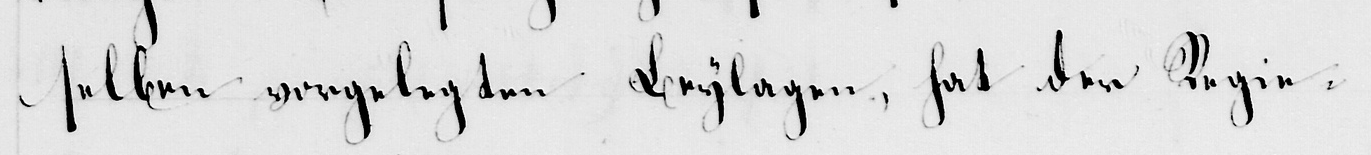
selben vorgelegten Beylagen, hat der Regie¬
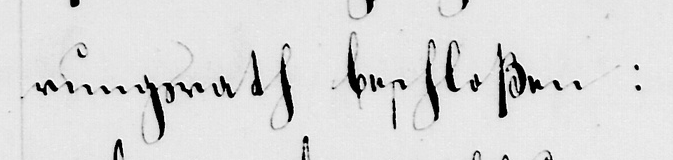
rungsrath beschloßen:
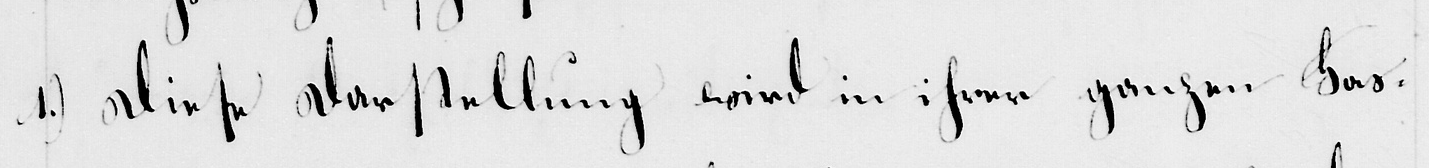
1.) Diese Darstellung wird in ihrer ganzen Fas¬
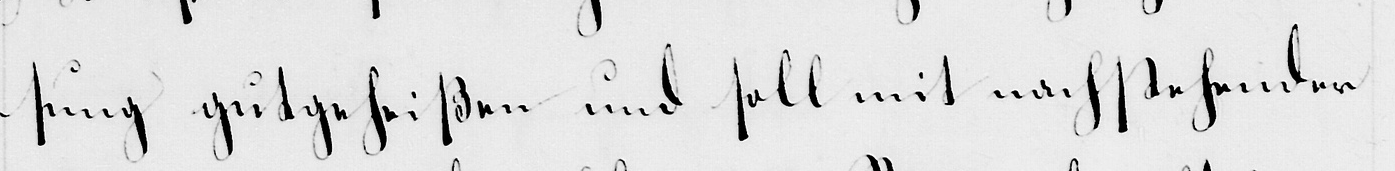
sung gutgeheißen und soll mit nachstehender
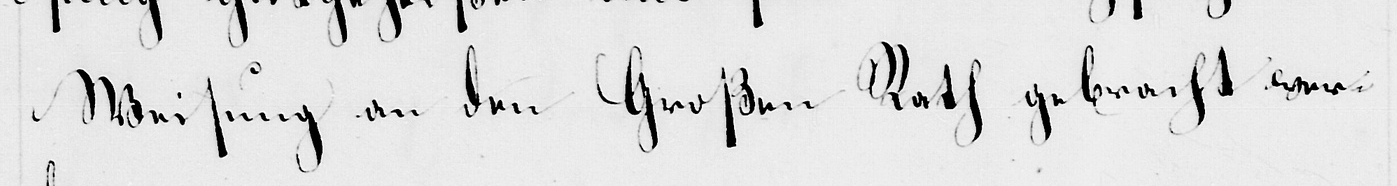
Weisung an den Großen Rath gebracht wer¬
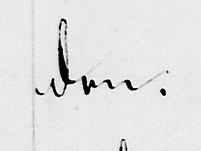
den.
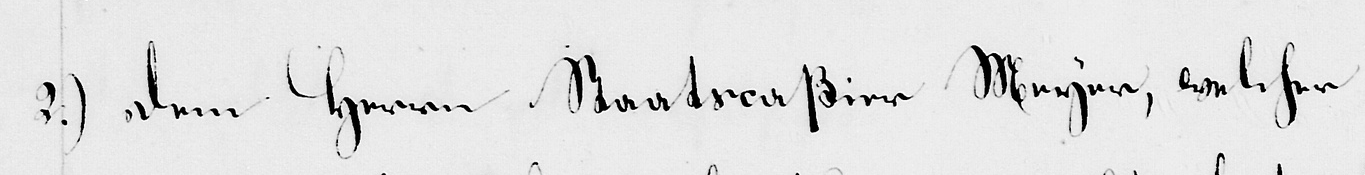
2.) dem Herrn Staatscaßier Meyer, welcher
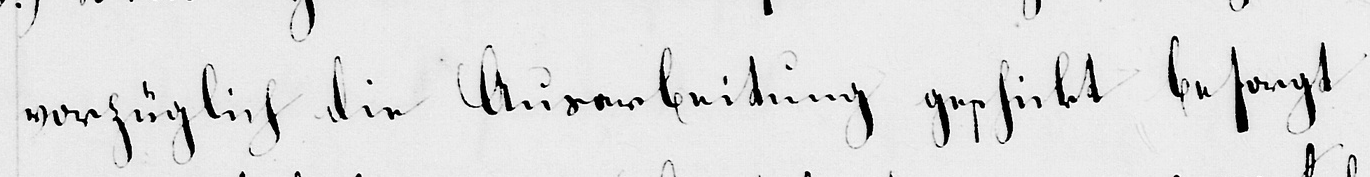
vorzüglich die Ausarbeitung geschickt besorgt
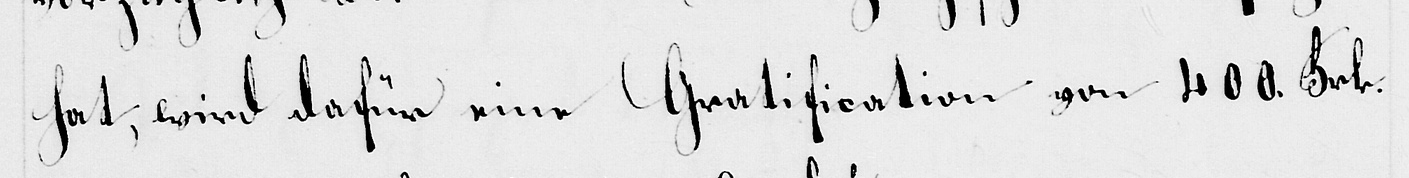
hat, wird dafür eine Gratification von 400. Frk.
